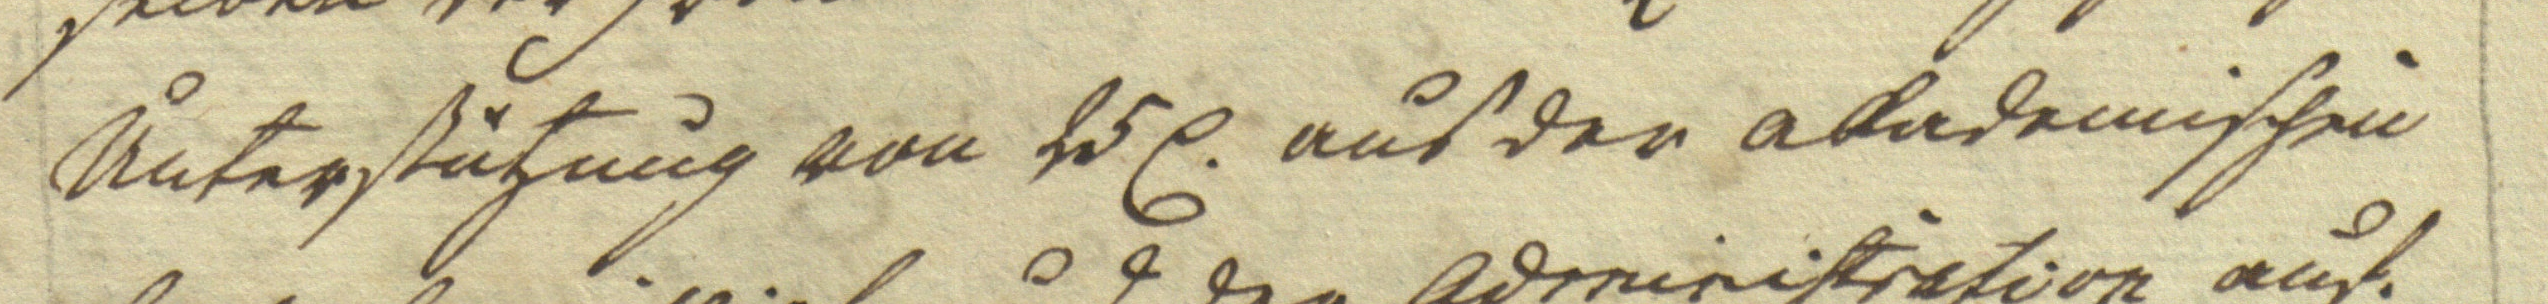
Unterstützung von 25 l. aus der akademischen
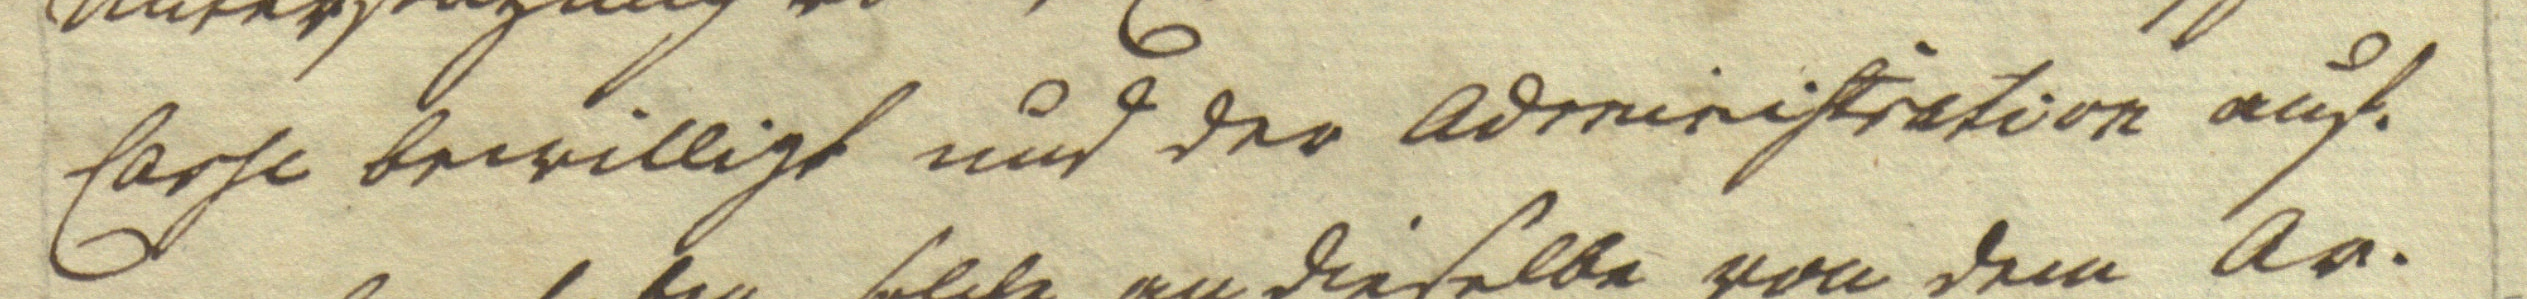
Casse bewilligt und der Administration auf¬
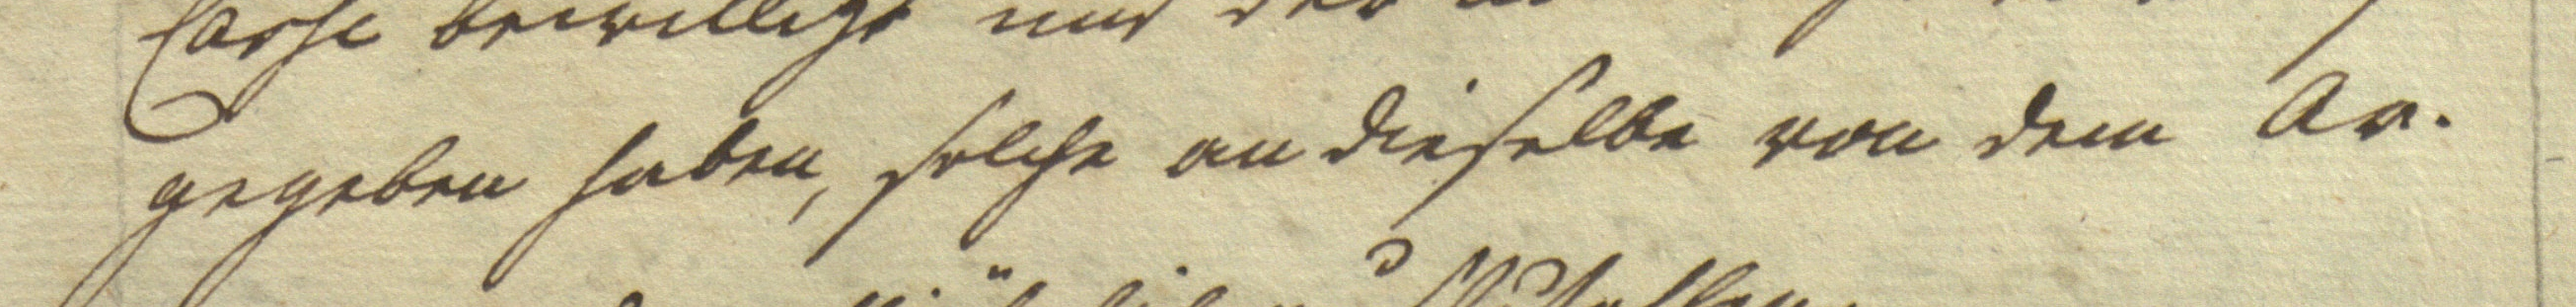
gegeben haben, solche an dieselbe von dem Ar¬
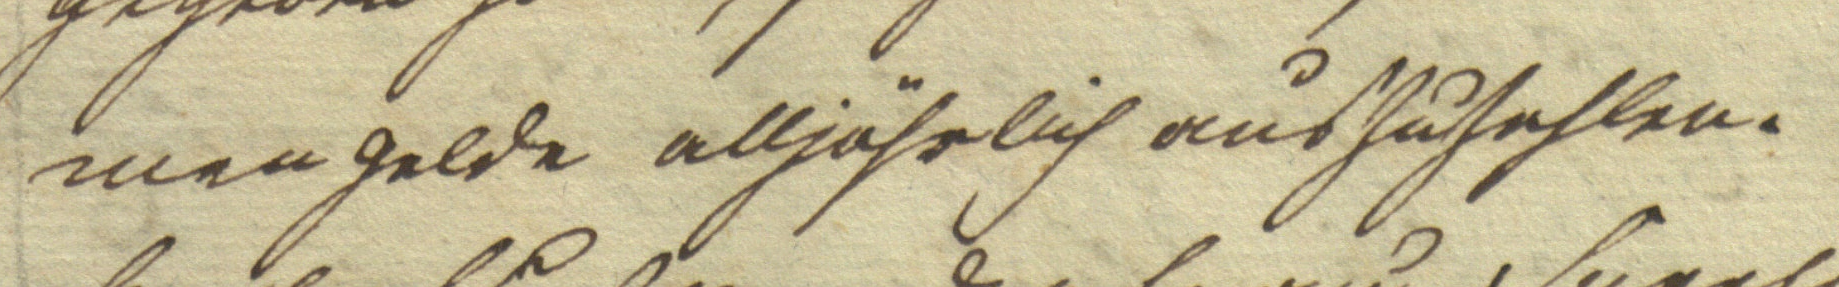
mengelde alljährlich auszuzahlen.
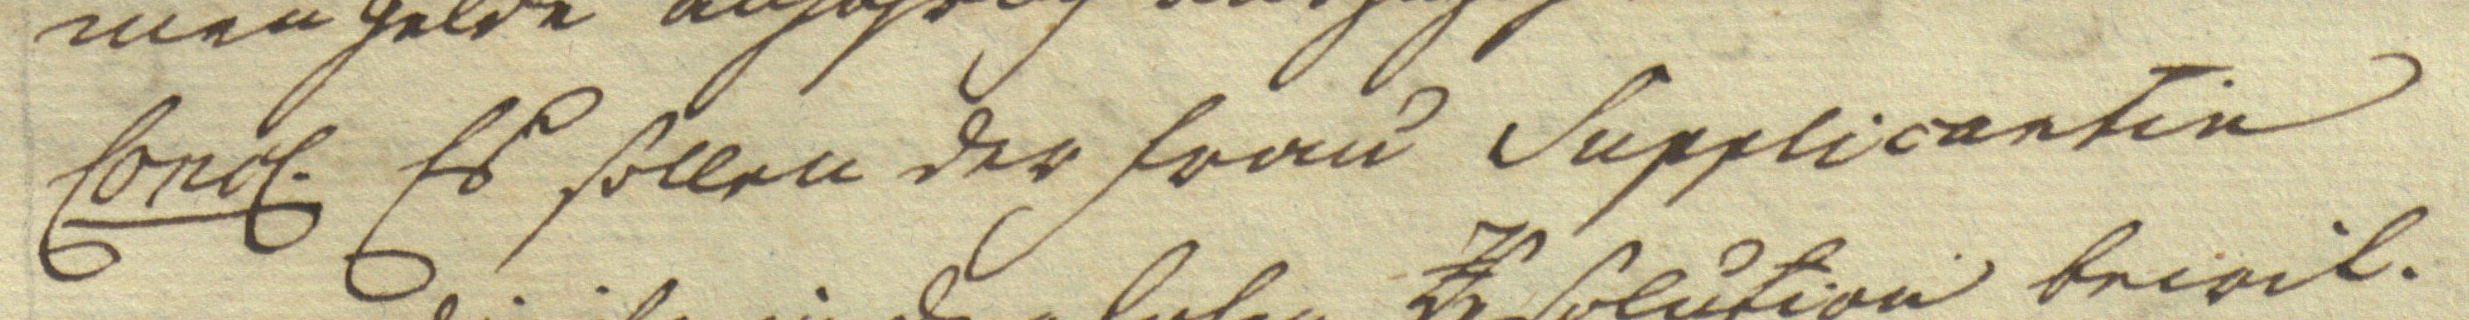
Concl. Es sollen der Frau Supplicantin
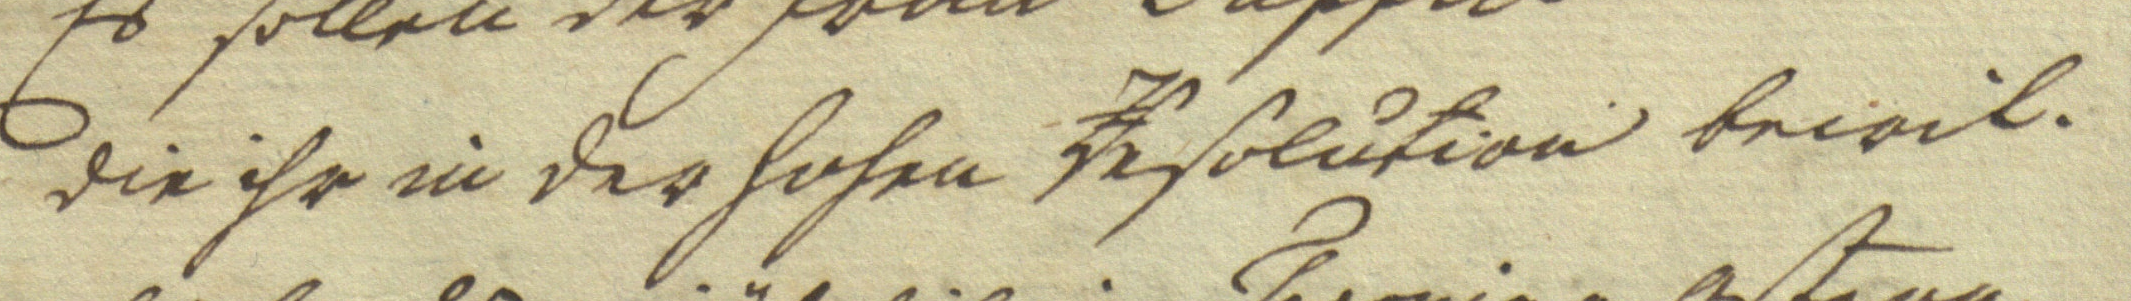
die ihr in der hohen Resolution bewil¬
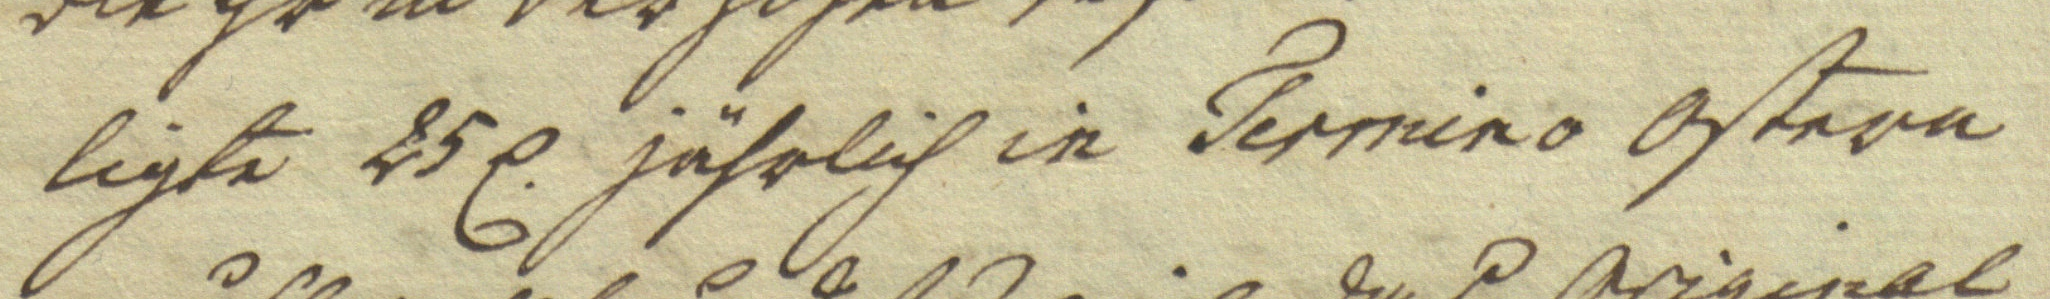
ligte 25 l. jährlich in Termino Ostern
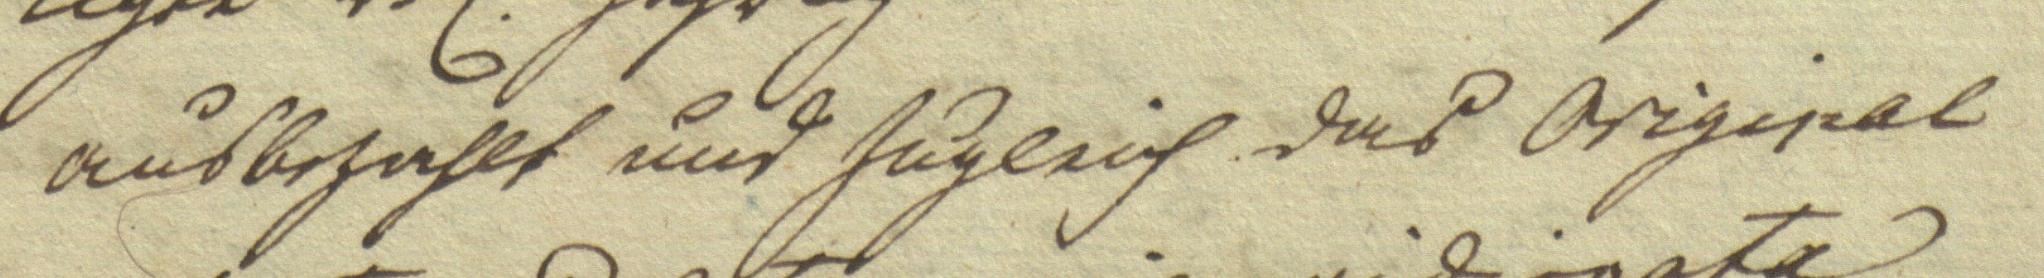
ausbezahlt und zugleich das Original
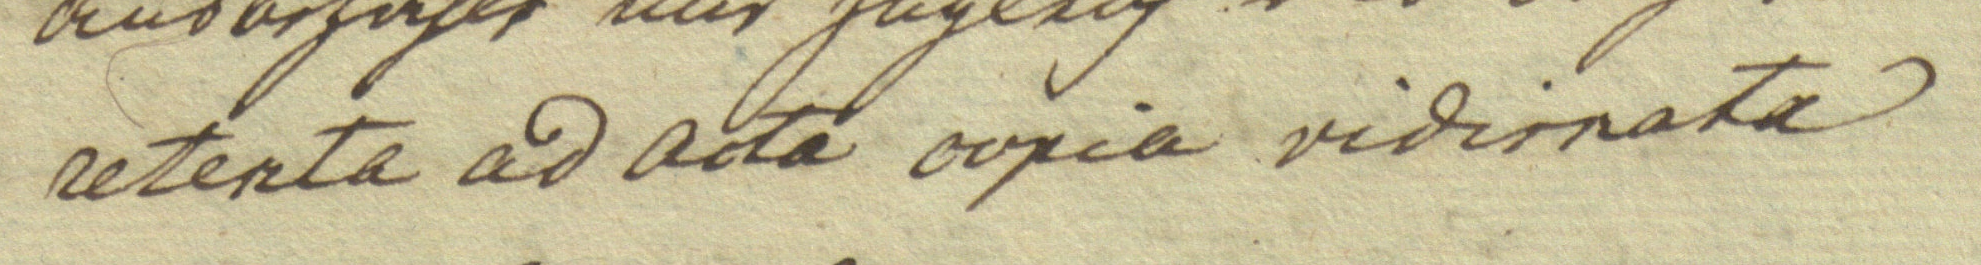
retenta ad acta copia vidimata
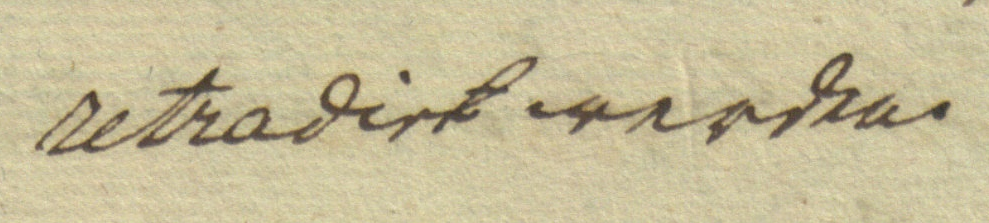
retradirt werden.
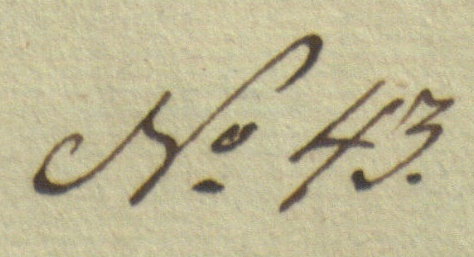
No 43.
